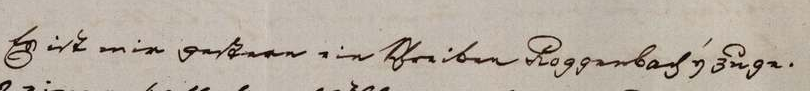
Es ist mir gestern ein Schreiben Roggenbach's zuge-
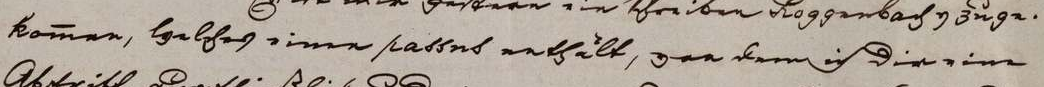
kommen, welches einen passus enthält, von dem ich Dir eine
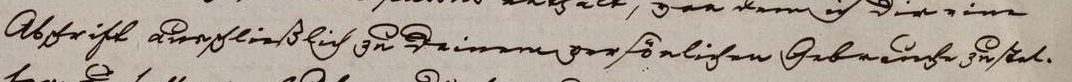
Abschrift ausschließlich zu Deinem persönlichen Gebrauche zustel-
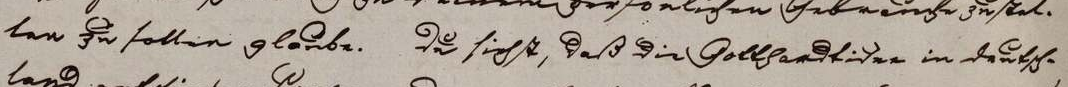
len zu sollen glaube. Du siehst, daß die Gotthardtidee in Deutsch-
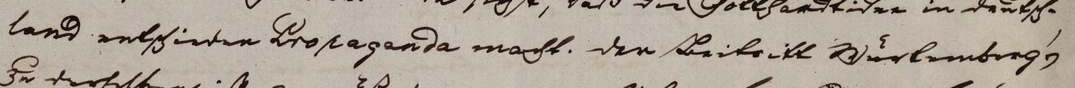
land entschieden Propaganda macht. Der Beitritt Würtemberg's
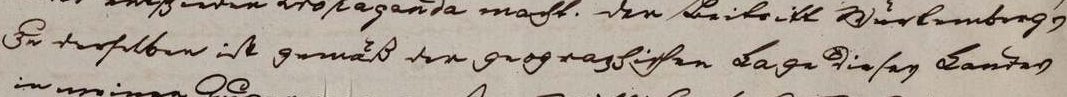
zu derselben ist gemäß der geographischen Lage dieses Landes
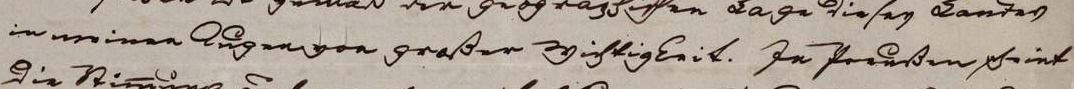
in meinen Augen von großer Wichtigkeit. In Preußen scheint
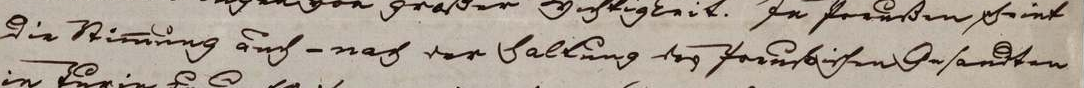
die Stimmung auch – nach der Haltung des Preußischen Gesandten
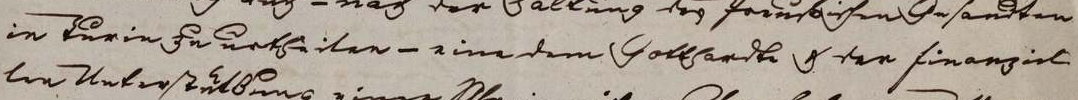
in Turin zu urtheilen – eine dem Gotthardte & der finanziel-
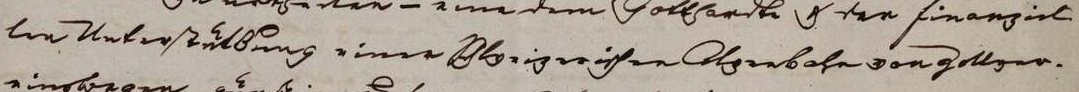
len Unterstützung einer Schweizerischen Alpenbahn von Zollver-
